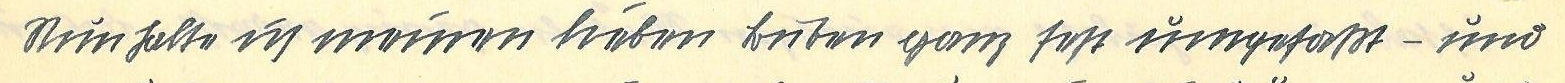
Nun halte ich meinen lieben Buben ganz fest umgefaßt – und
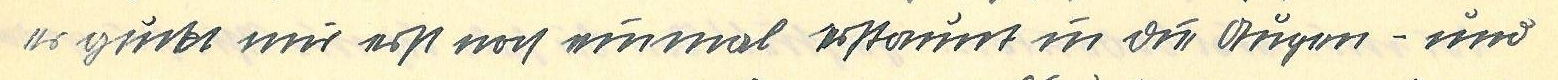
er guckt mir erst noch einmal erstaunt in die Augen – und
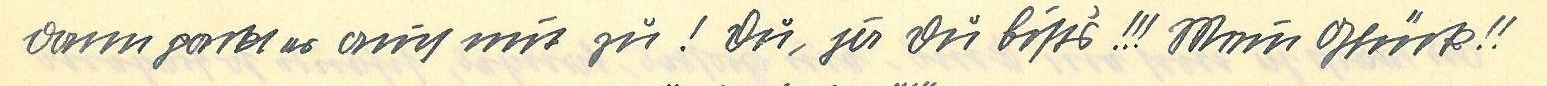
dann packt er auch mit zu! Du, ja Du bist’s!!! Mein Glück!!
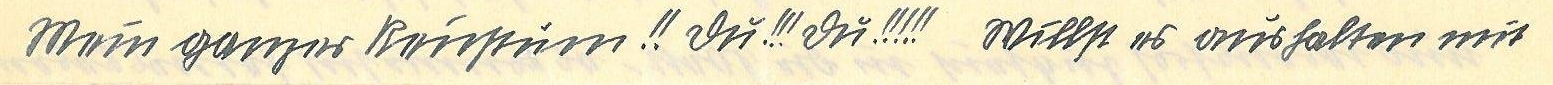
Mein ganzer Reichtum!! Du!!! Du!!!!! Willst es aushalten mit
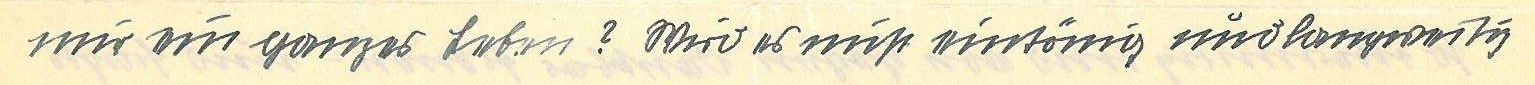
mir ein ganzes Leben? Wird es eintönig und langweilig
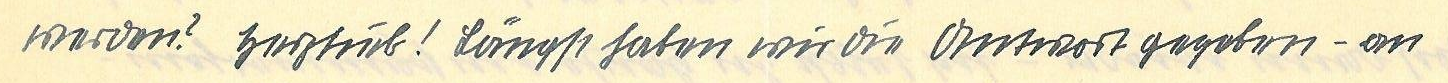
werden? Herzlieb! Längst haben wir die Antwort gegeben – an
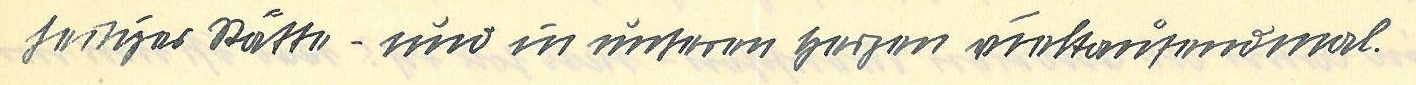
heiliger Stätte – und in unseren Herzen vieltausendmal.
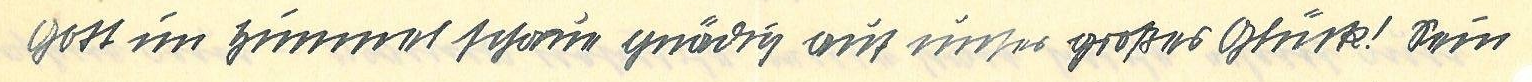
Gott im Himmel schaue gnädig auf unser großes Glück! Sein
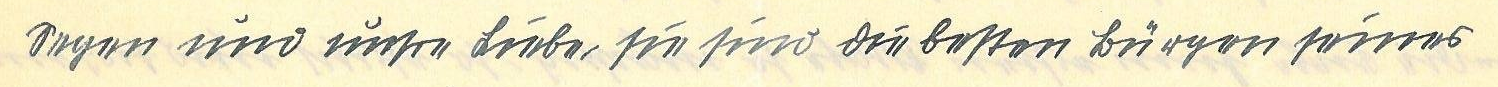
Segen und unsre Liebe, sie sind die besten Bürgen seines
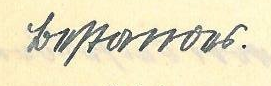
Bestandes.
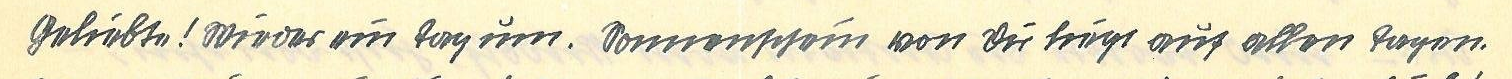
Geliebte, wieder ein Tag um. Sonnenschein von Dir liegt auf allen Tagen.
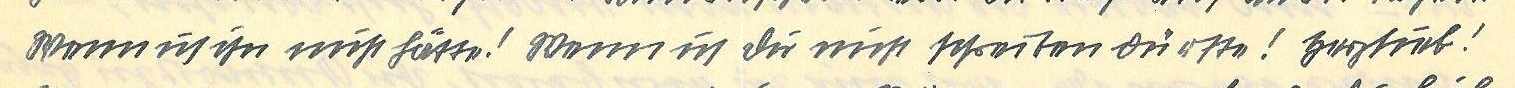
Wenn ich ihn nicht hätte! Wenn ich Dir nicht schreiben dürfte! Herzlieb!
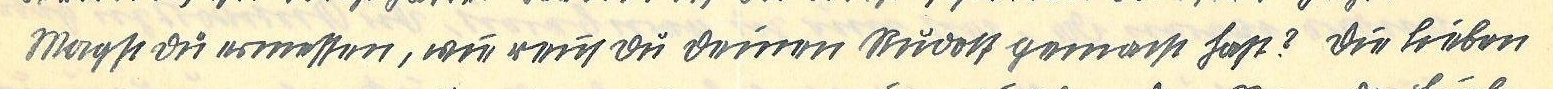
Magst Du ermessen, wie reich Du Deinen Rudolf gemacht hast? Die lieben
